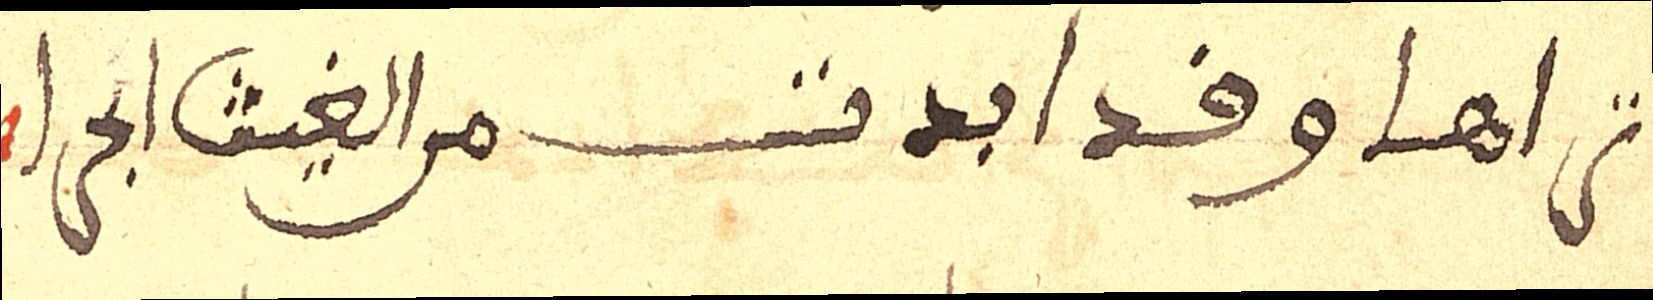تراها وقد ابدت من الغيث الجرا
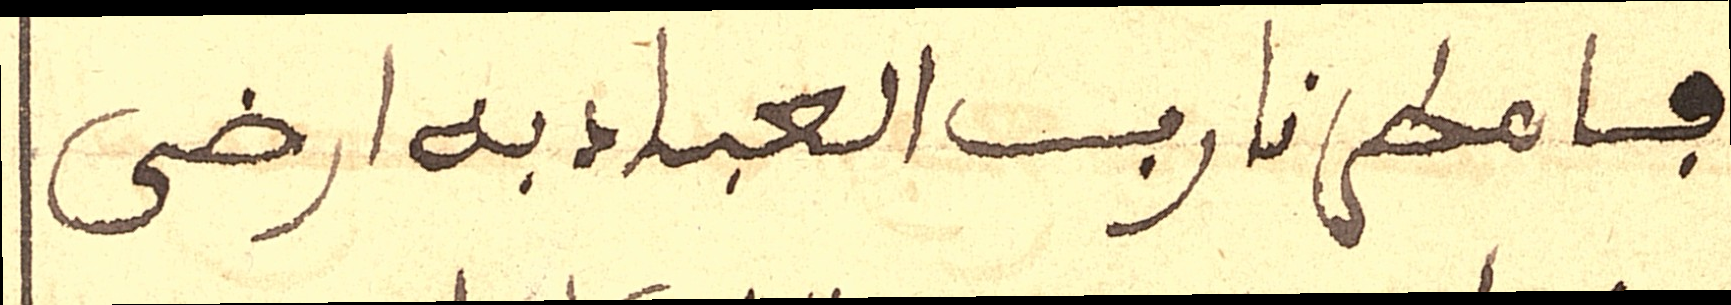فامطرنا رب العباد به ارض
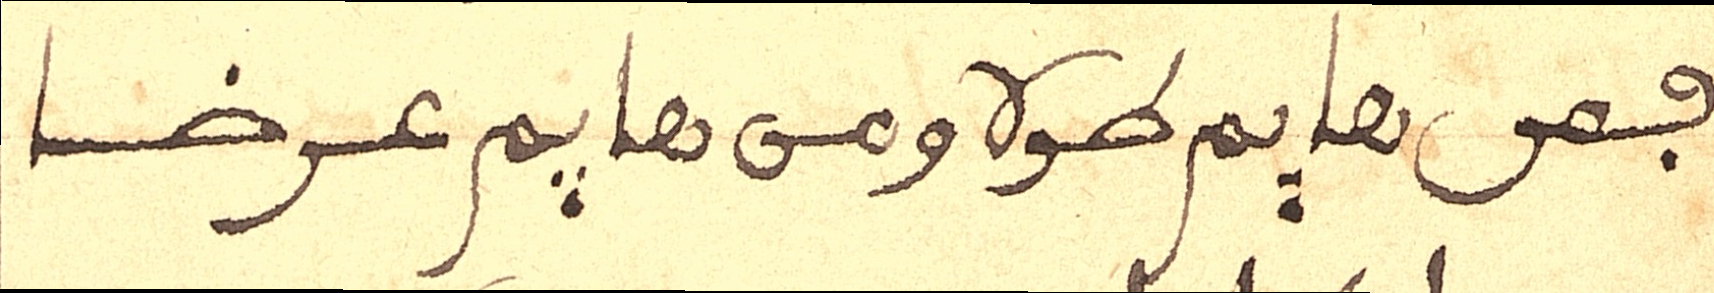فمن هائم طولا ومن هائم عرضا
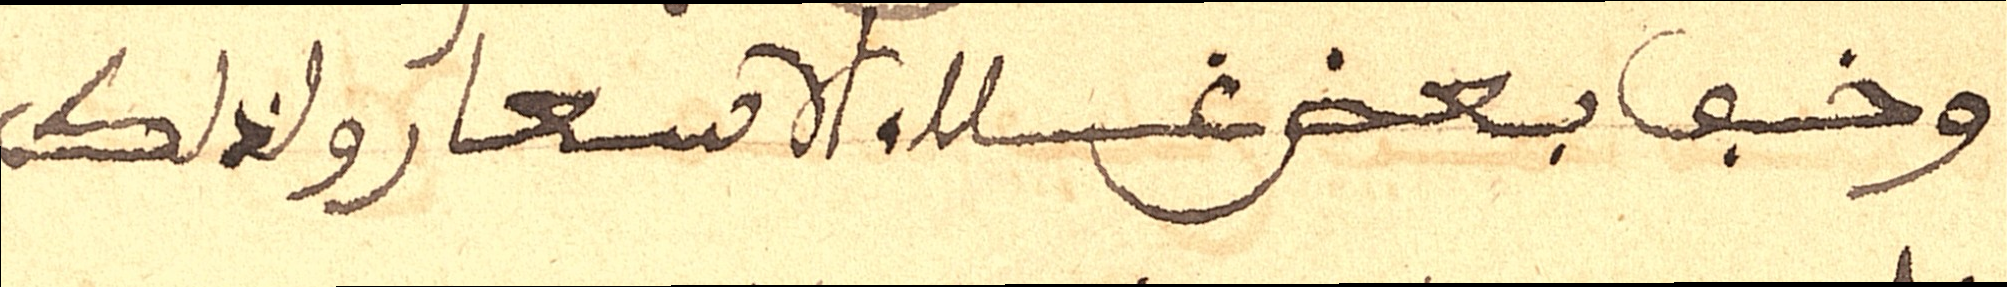وخف بعض غلاء الاسعار ولذلك
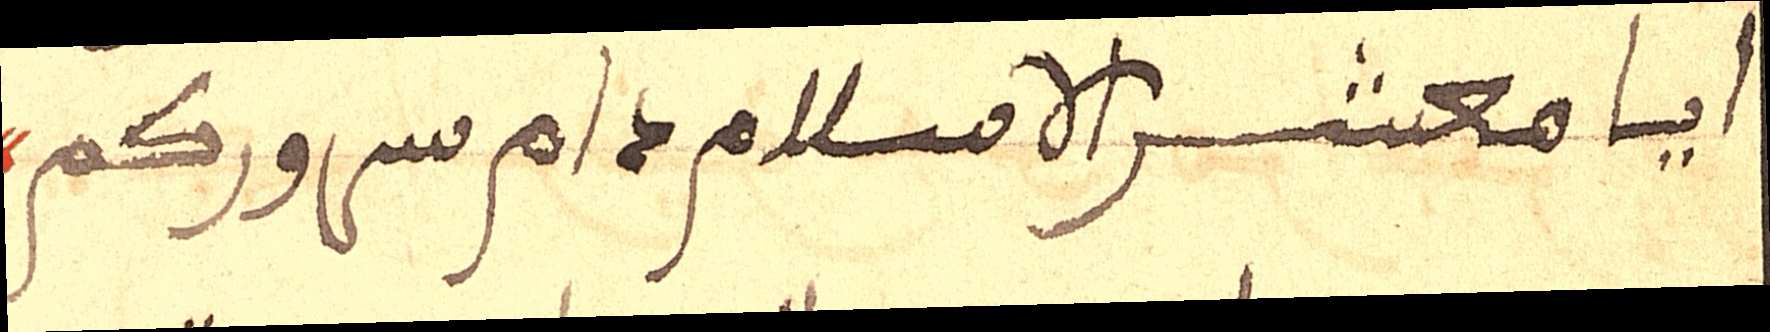ايا معشر الاسلام دام سروركم
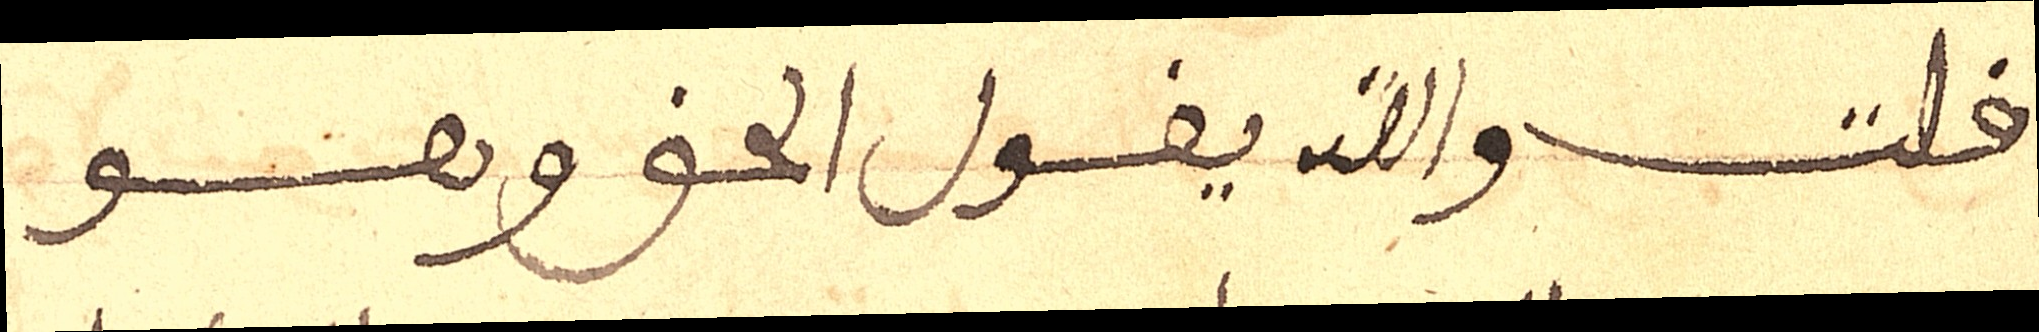قلت والله يقول الحق وهو
